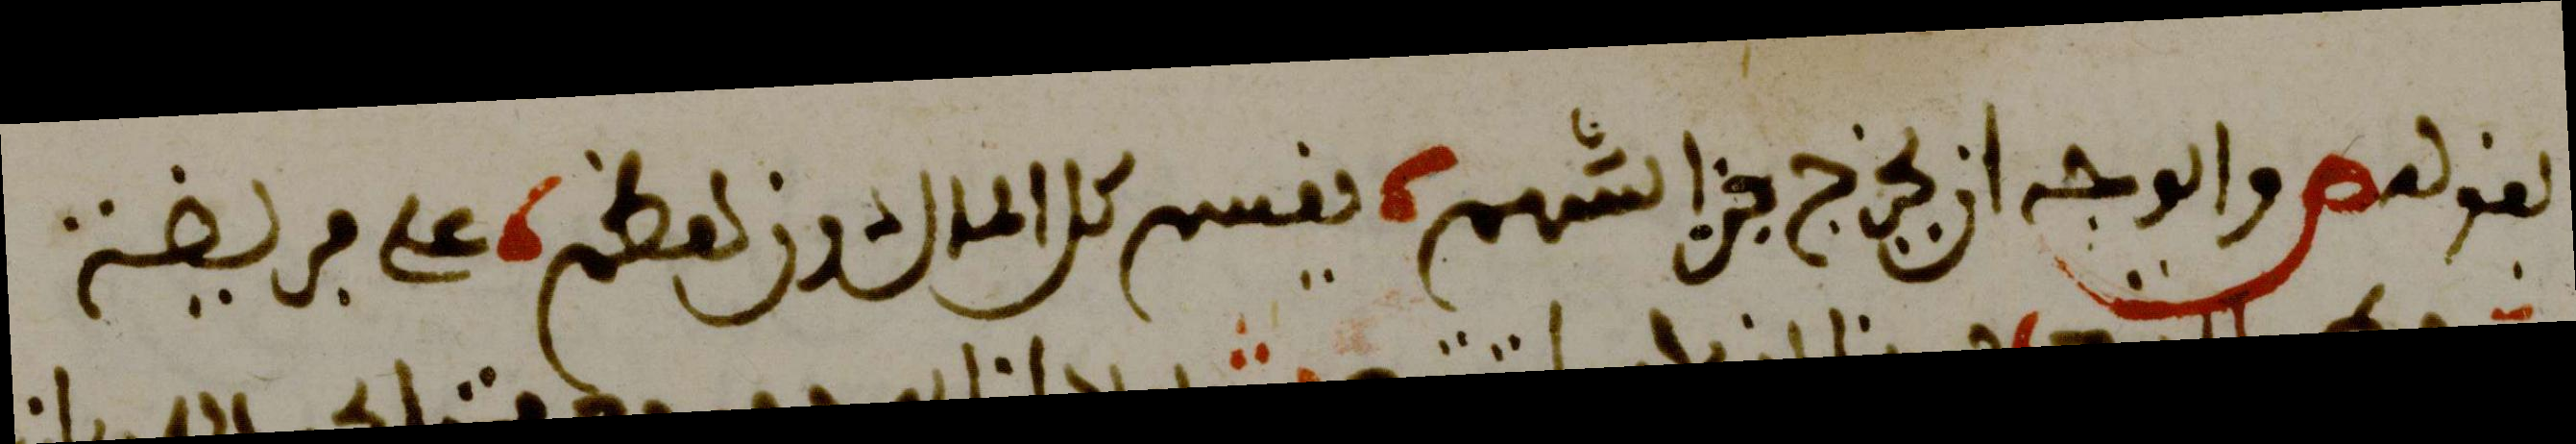بقوله ص الوجه ان يخرج جزء السَّهم يقسم كل المال دون هظم على فريضة
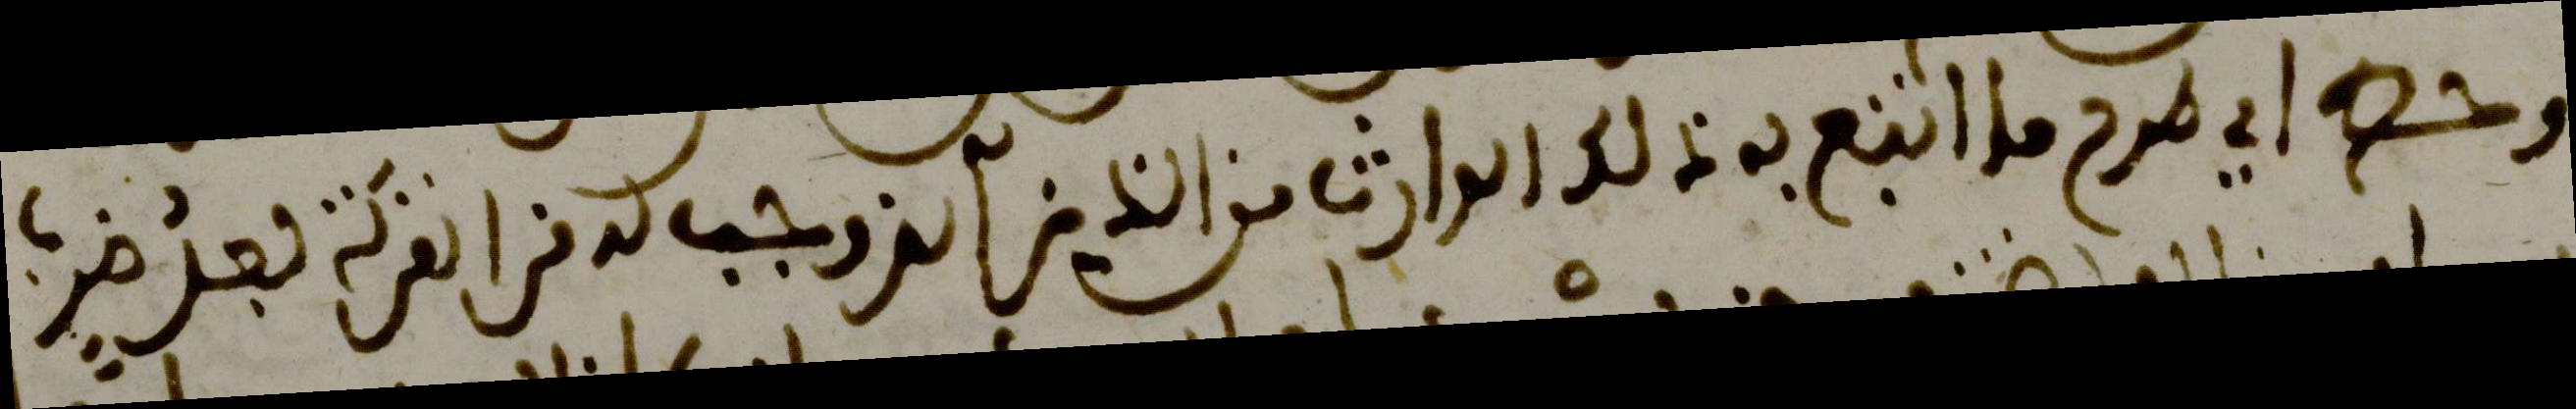وحط اي طرح ما اتبع به ذلك الوارث من الدين الذوجب له من التركة بعد ضرب
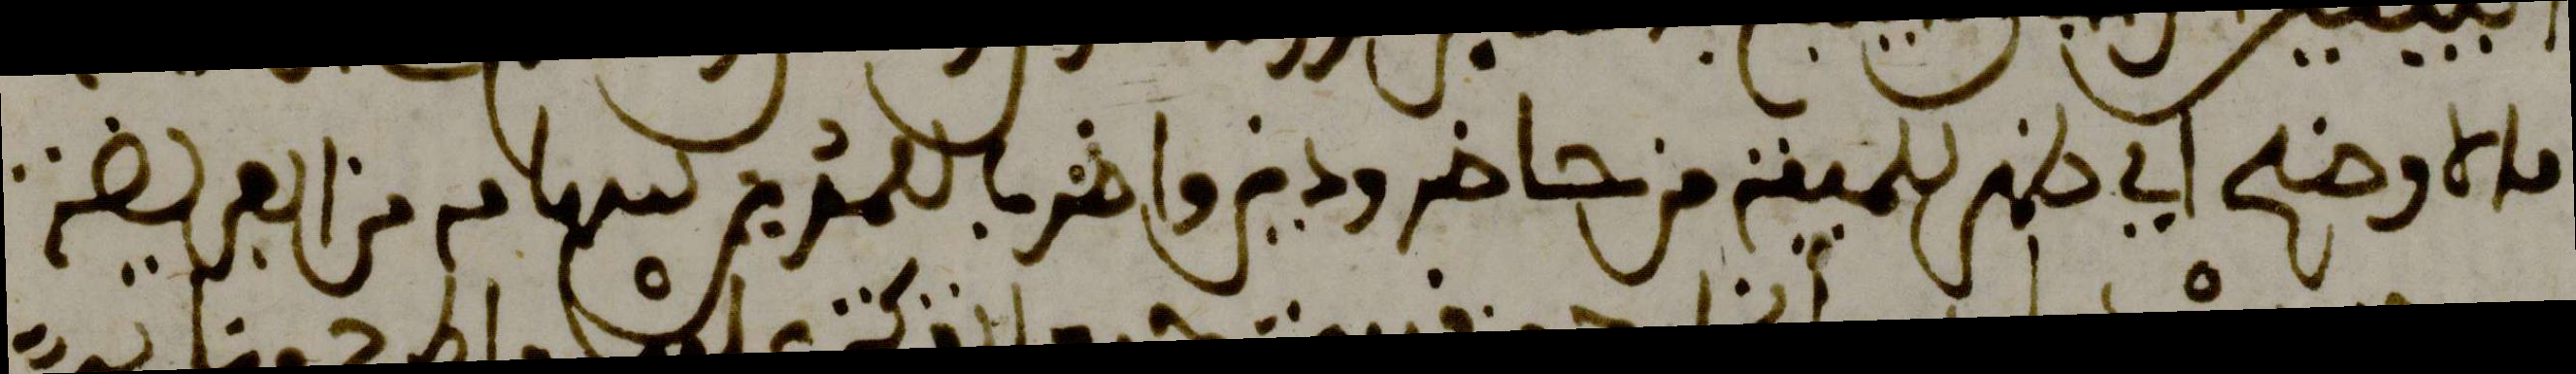مالا وضح اي ظهر للمية من حاضر ودين واضرب للمدين سهامه من الفريضة
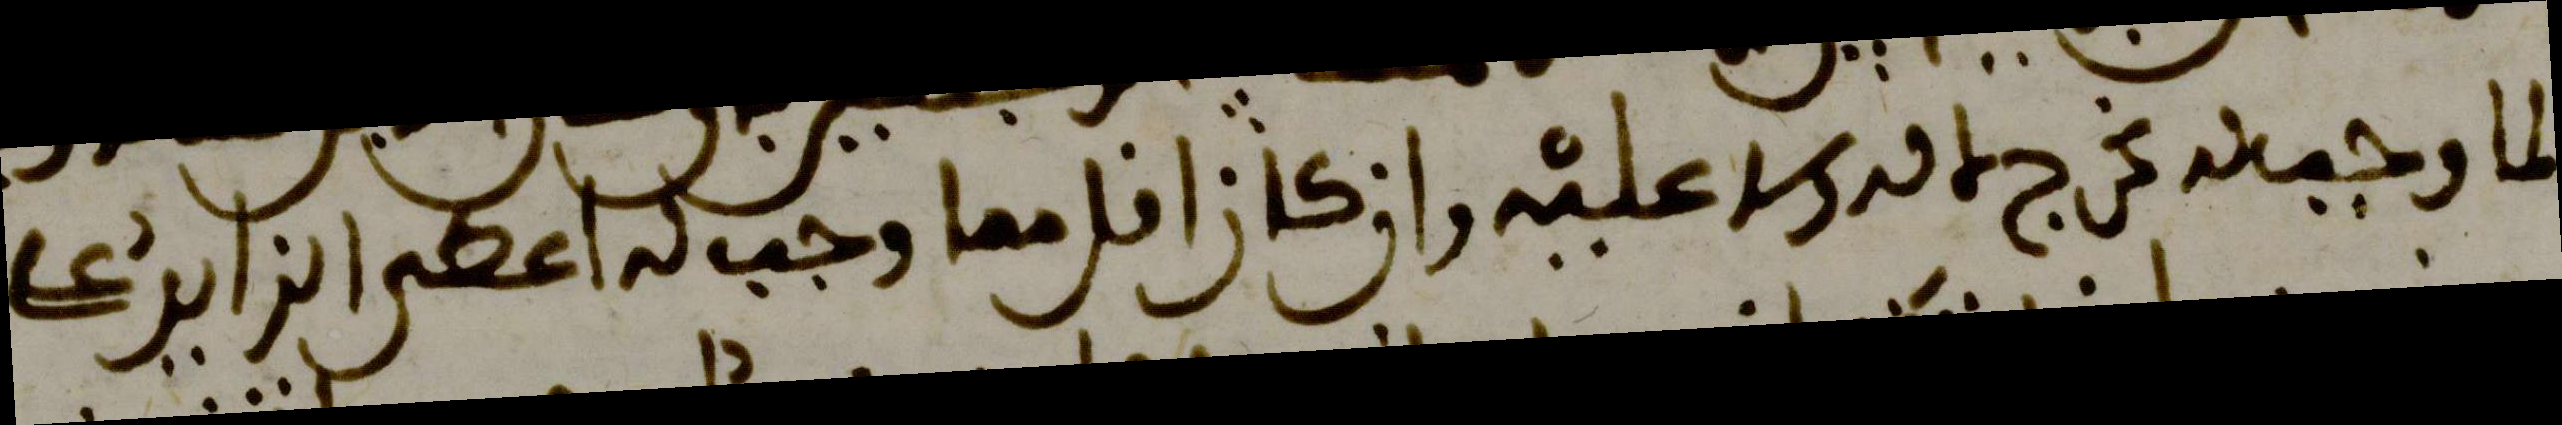لما وجب له خرج لا له ولا عليْه وان كان اقل مما وجب له اعطى الزايد على
